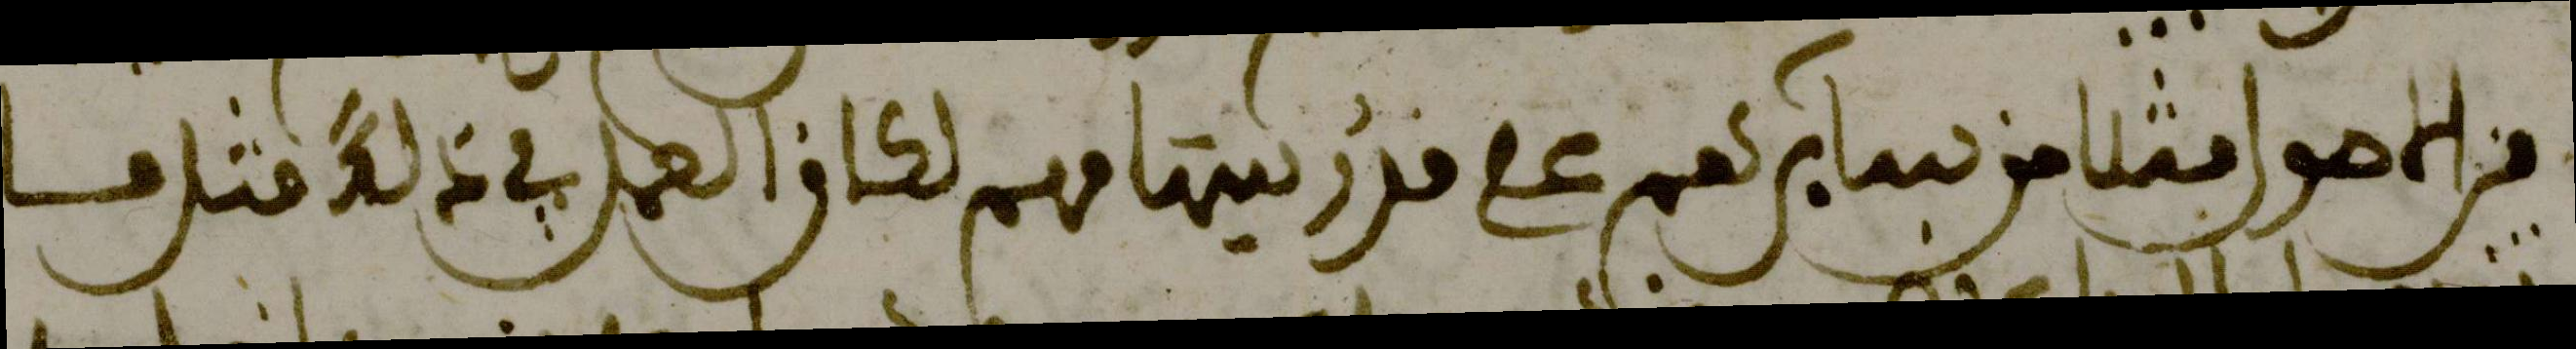من سائرهم على قدر سِهامهم لكان العمل في ذلك مثل ما
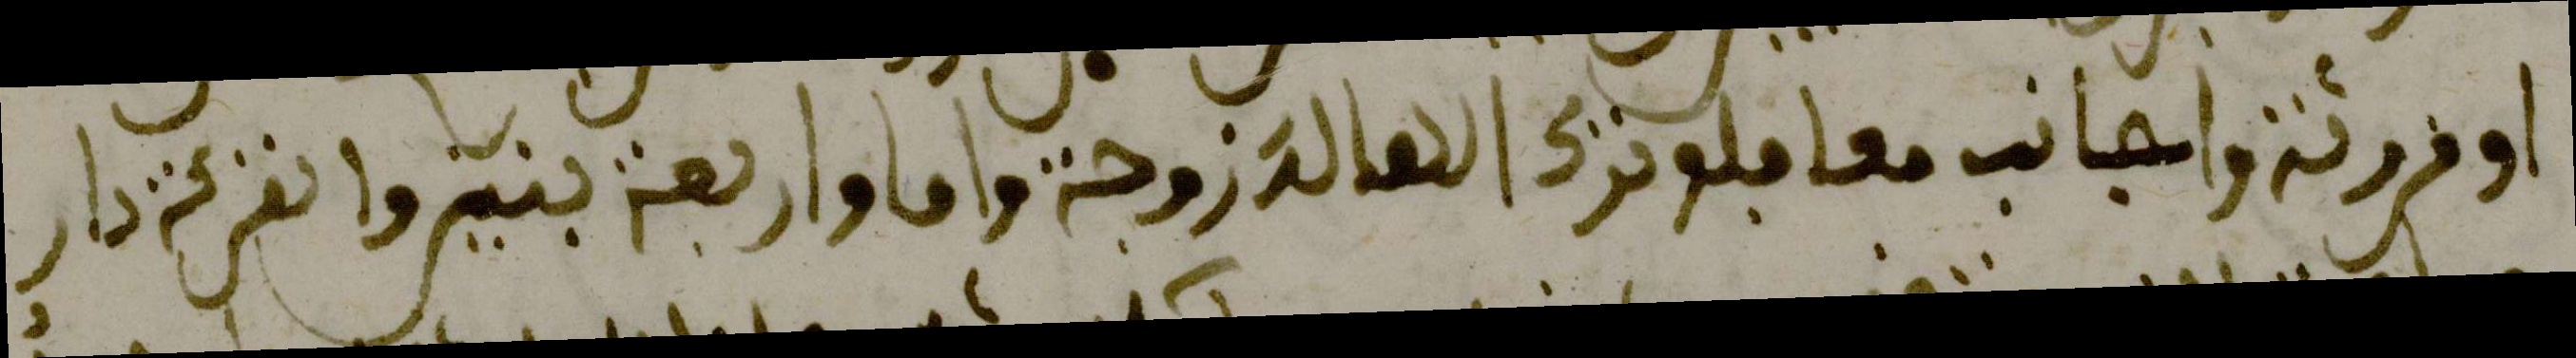او من ورثة واجانب معا فلو ترك الهالك زوجة واما واربعة بنين والتركة دار
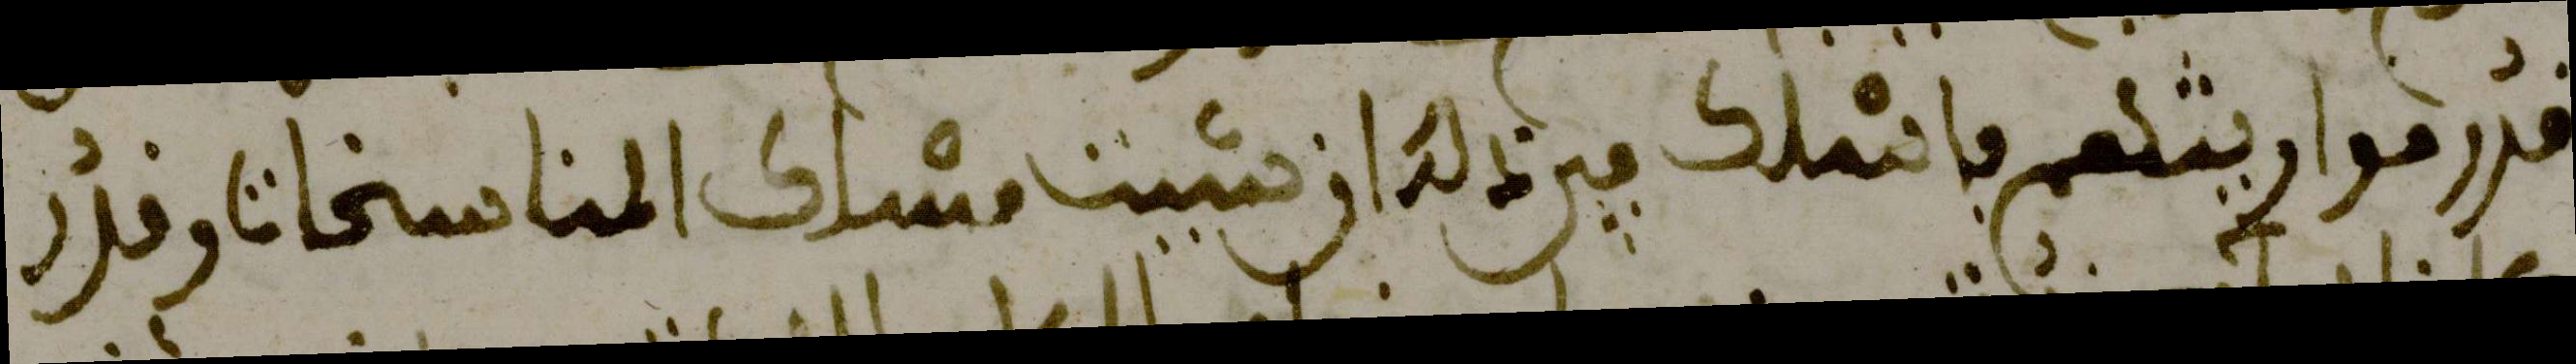قدر مواريثهم فاسْلك في ذلك ان شيت مسْلك المناسخات وقدر
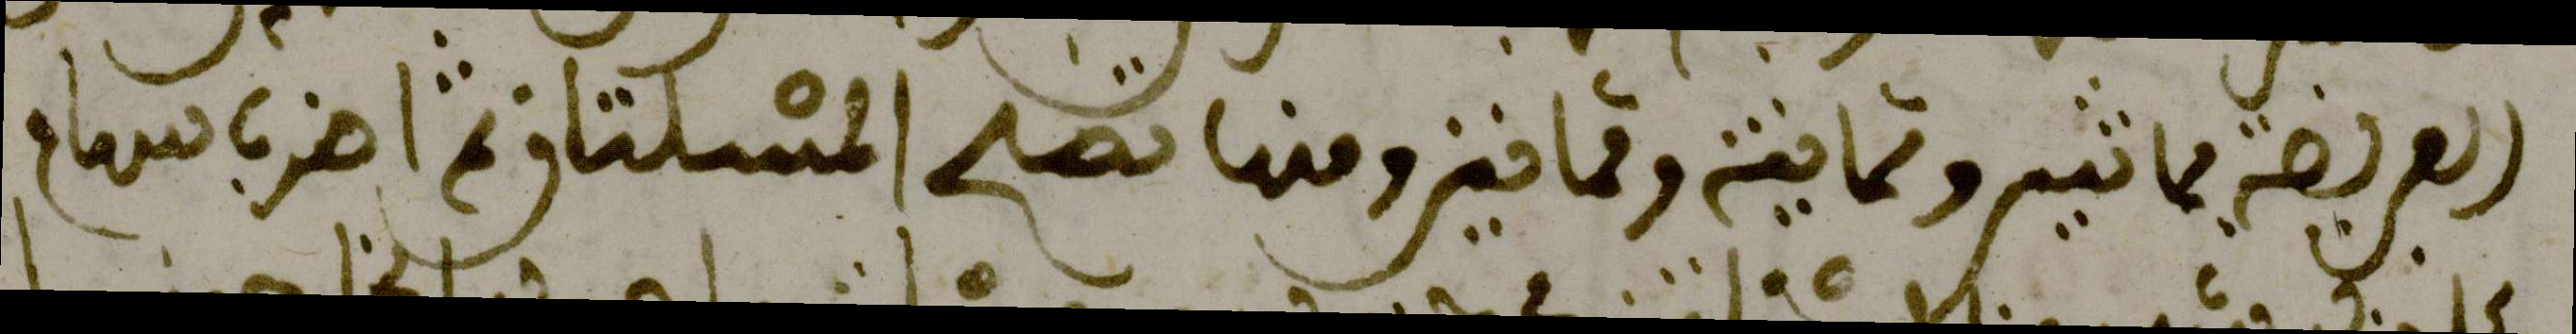الفريضة بمايتين وثمانية وثمانين ومنها تصح المسْلتان ثم اضرب سهام
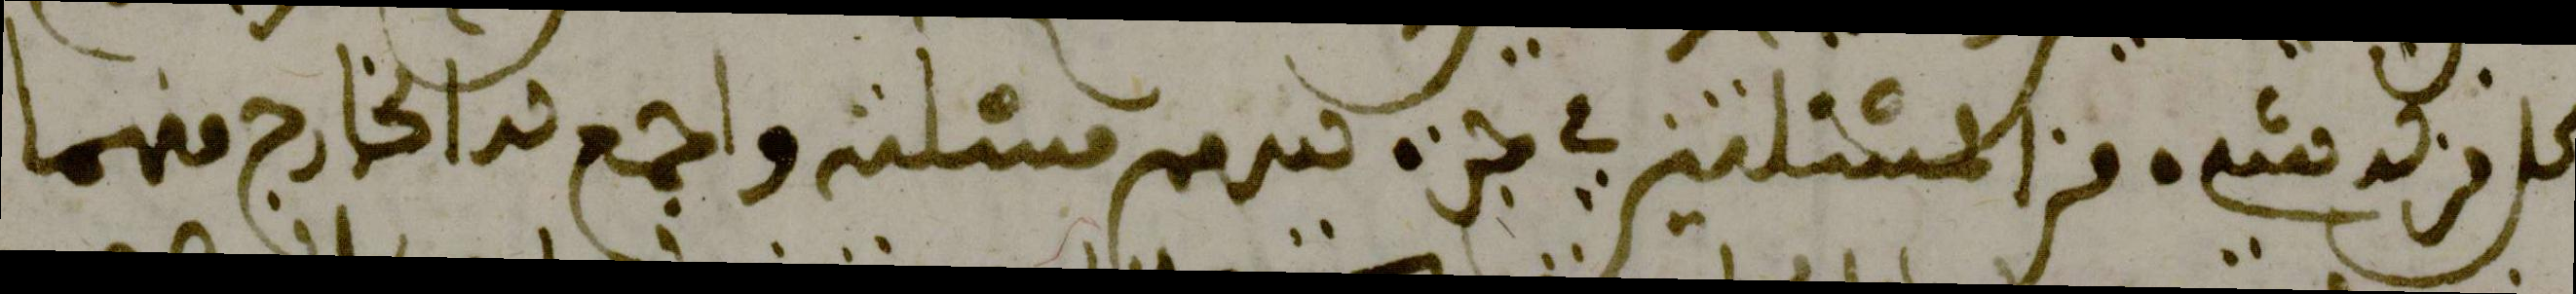كل من له شيء من المسْئلتين في جزء سهم مسْلته واجمع له الخارج منهما
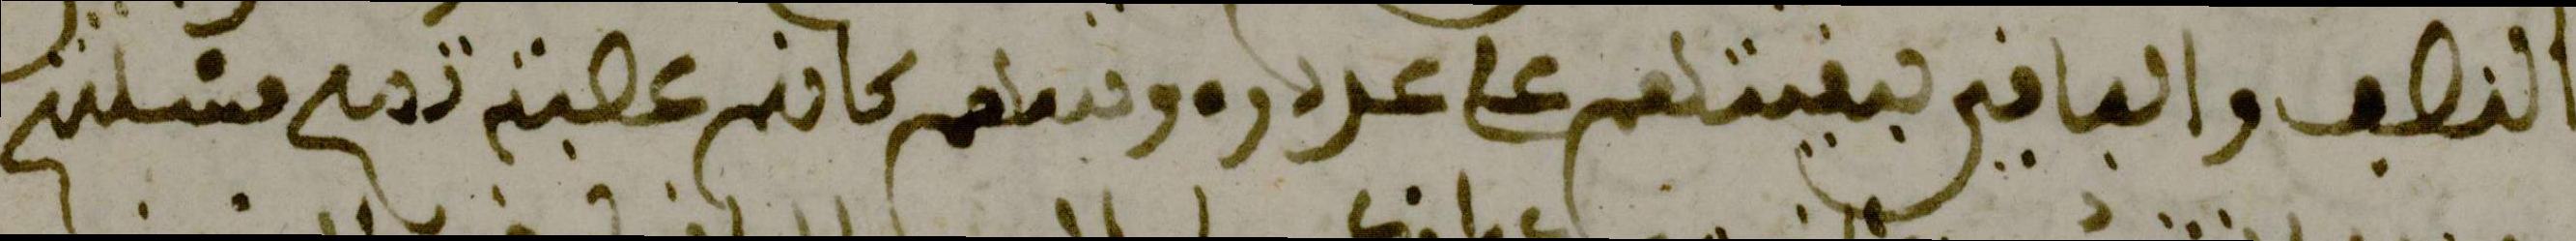النصف والباقي لبقيتهم على عدد رءوسهم كانهم عصبة تصح مسْلتهم
